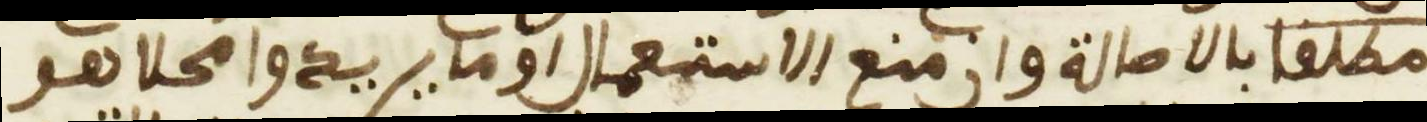مطلقا بالاصالة وان منع الاستعمال او ما يريدوا محلا هو
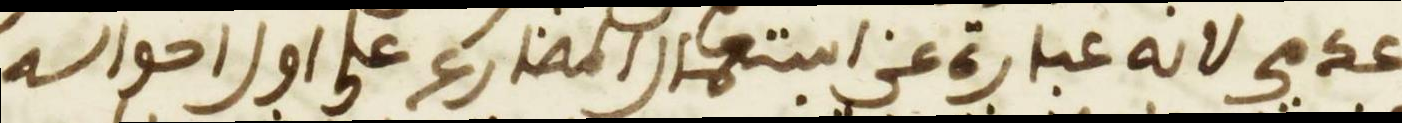عدمي لانه عبارة عن استعمال المضارع على اول احواله
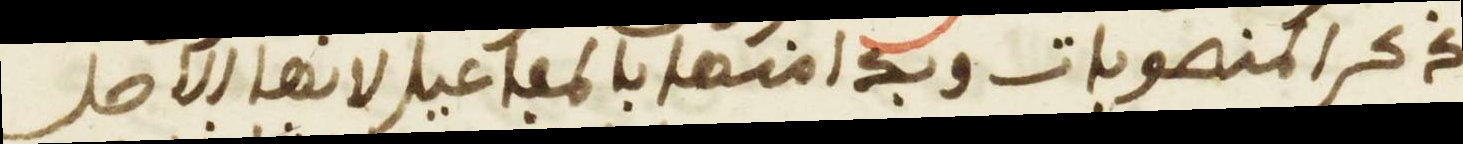ذكر المنصوبات وبدا منها بالمفاعيل لانها الاصل
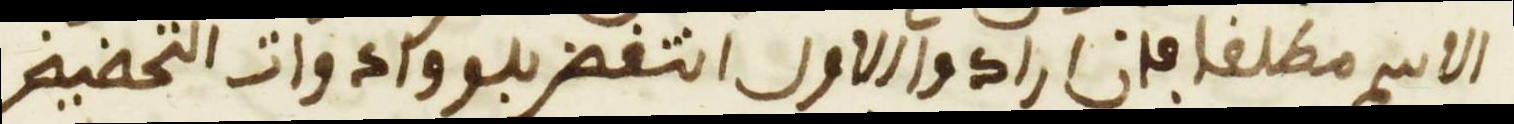الاسم مطلقا فان ارادوا الاول انتقض بلو وادوات التحضيض
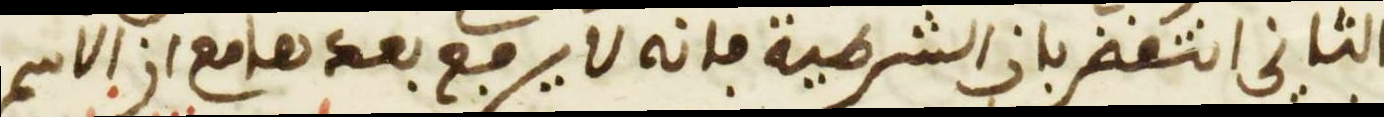الثاني انتقض بان الشرطية فانه لا يرفع بعدها مع ان الاسم
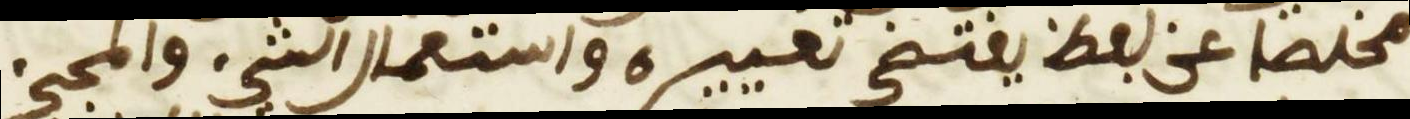مخلصا عن لفظ يقتض تغييره واستعمال الشيء والمجيء
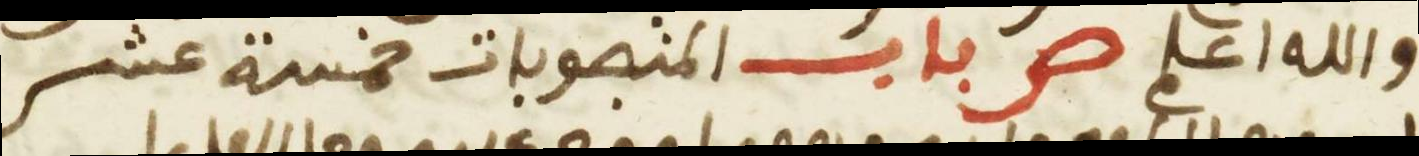والله اعلم ص باب المنصوبات خمسة عشر
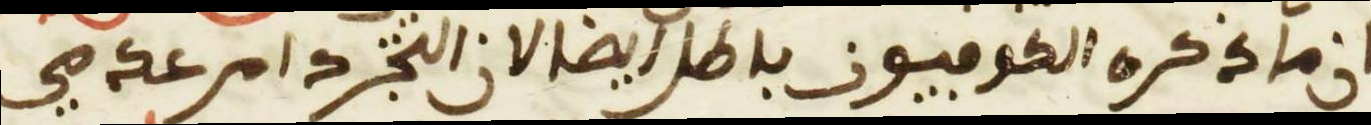ان ما ذكره الكوفيون باطل ايضا لان التجرد امر عدمي
